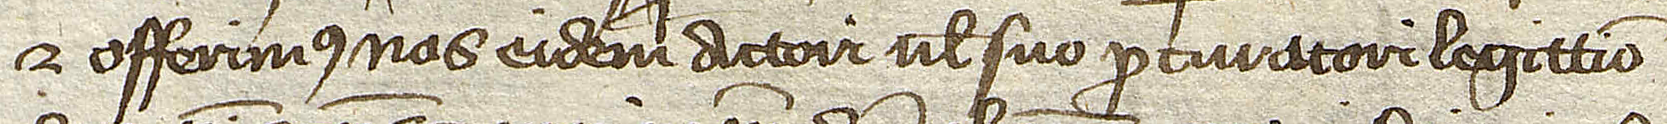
@ offerim* nos eidem Actori u*l ſuo p*curatori legitti*o
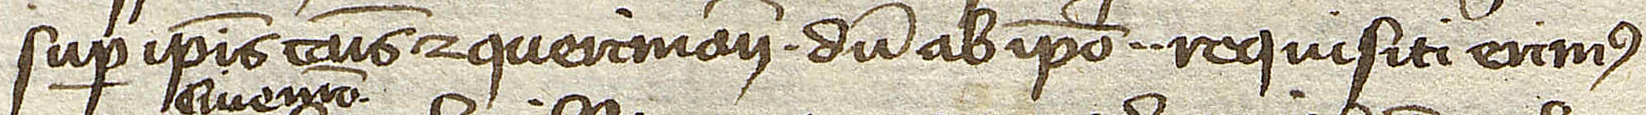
ſup* ip*is caus* @ querimon* . du* ab ip*o . . requiſiti erim*
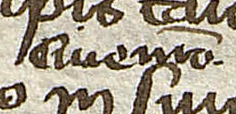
Ciue n*ro
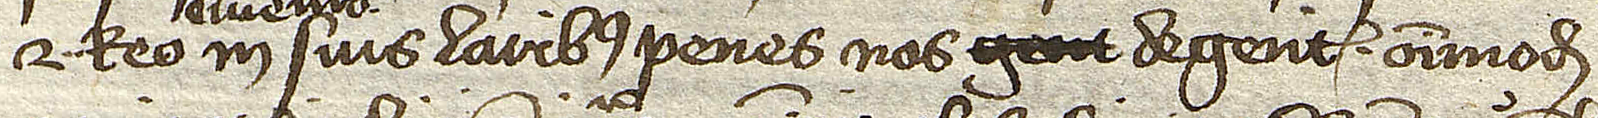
@ Reo in ſuis larib* penes nos gent degent* . o*imod*
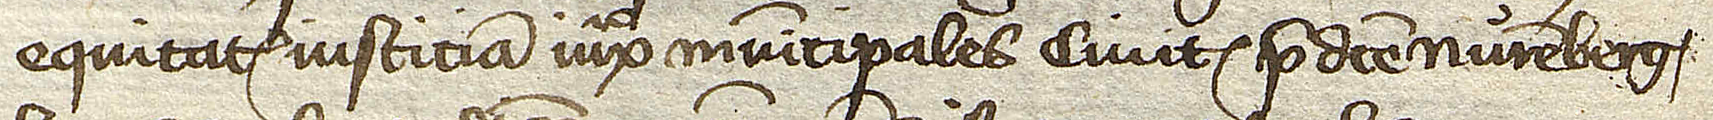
equitat* iuſticia* iux* mu*icipales Ciuit* p*d*c*e Nüre*berg*
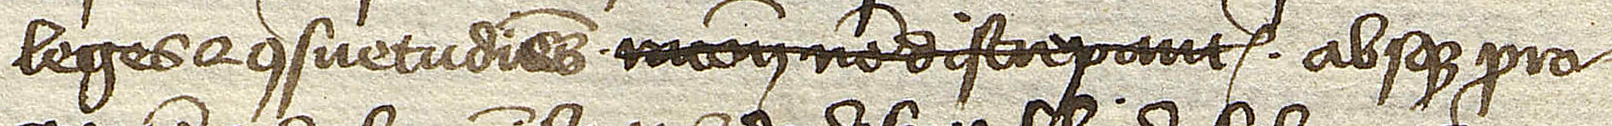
leges @ *ſuetudi*es . racon no* diſcrepant* . abſq* p*ro=
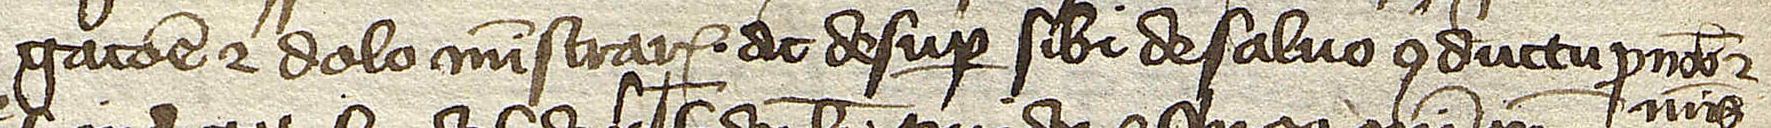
gac*o*e @ dolo mi*ſtrar* . Ac deſup* ſibi de ſaluo *ductu p* nob* @
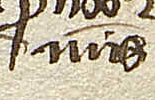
n*ris
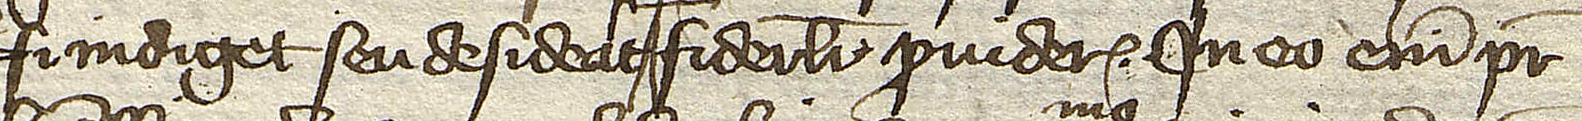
ſi indiget ſeu deſide*at fiderl*r . p*uider* . In eo eni* p*r
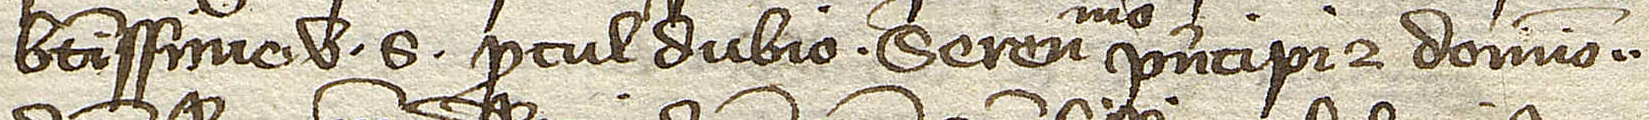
b*tiſſimo v . S . p*cul dubio . Seren* p*ncipi @ domi*o . .
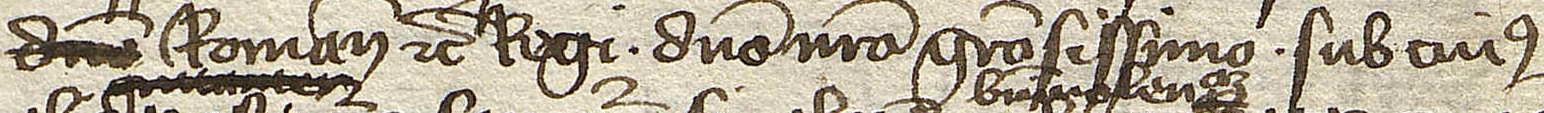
dn%* Roman* ec* Regi . d*no n*ro g*r*oſiſſimo . ſub cui*
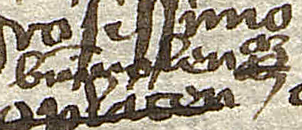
bniuolena*
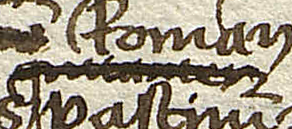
%%%%%%
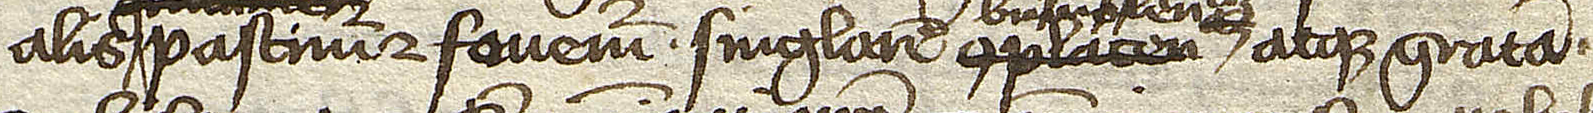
alis paſtim* @ fauem* . ſing*lare* *placen atq* grata*
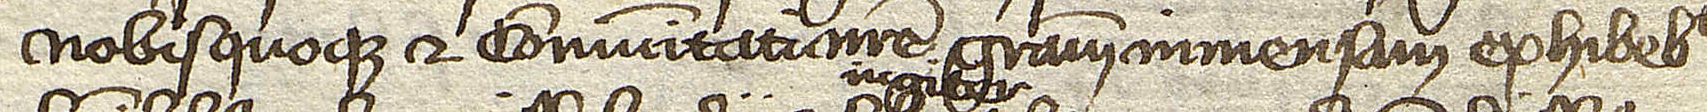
nobiſquoq* @ Co*mu*itati n*re gra*m immenſam exhibeb*
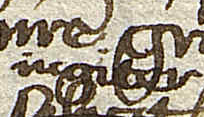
iugiter
